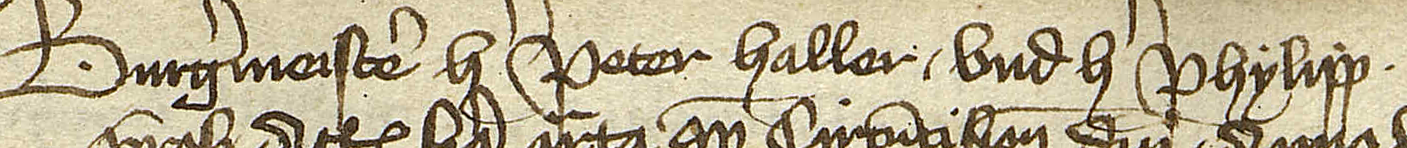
Burg*meiſte* h* Peter haller / vnd h* Phylipp
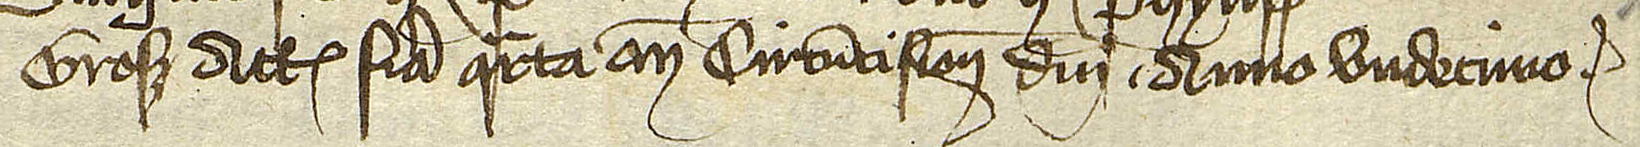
Groſʒ / Act* fia* qrta* an* Circu*ciſion* dni / Anno vndecimo §
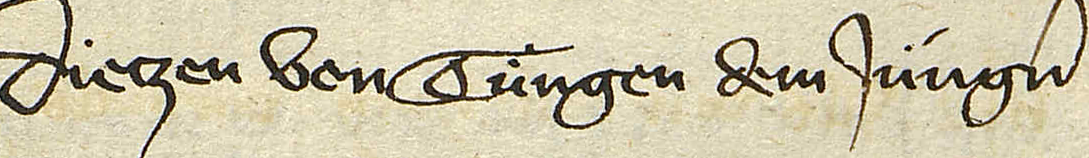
Diecʒen von Tüngen dem Iüngn*
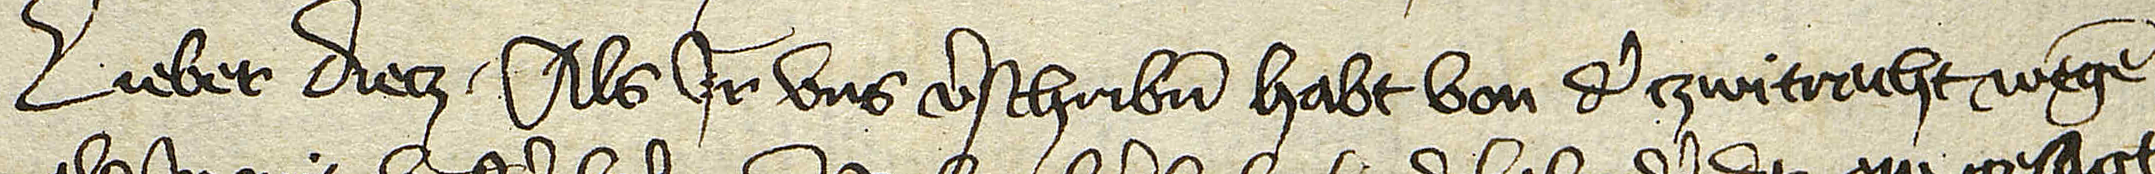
Lieber Diecʒ / Als Ir vns v*ſchribn* habt von d* cʒwitracht wege*
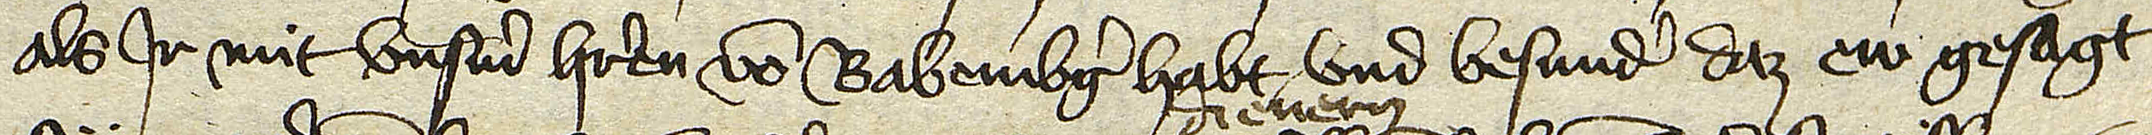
als Ir mit vnſm* hr*en vo* Babembg* habt / vnd beſund* daʒ ew geſagt
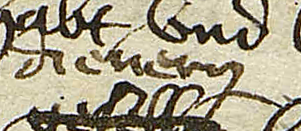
dienern
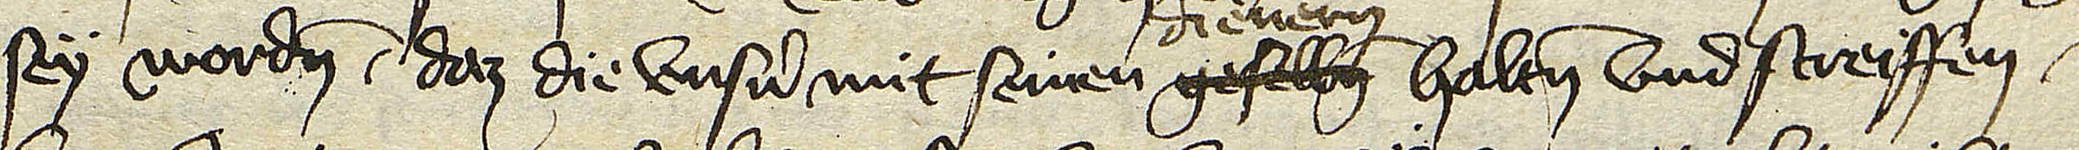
ſey wordn* / daʒ die vnſn* mit ſeinen geſelln* haltn* vnd ſtreiffen /
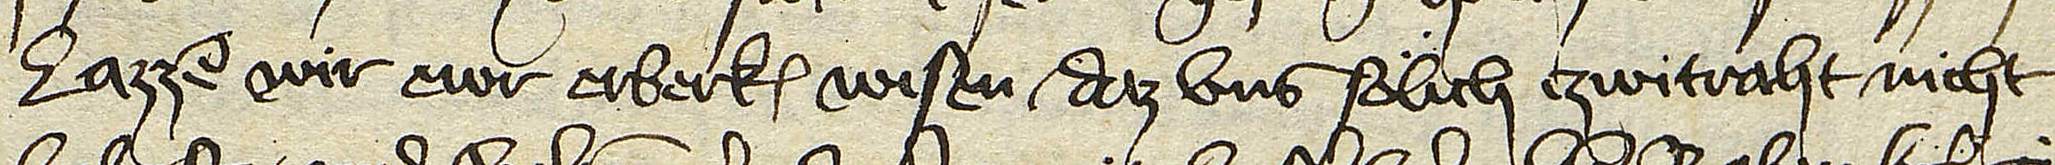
laʒʒe* wir ewr erberk* wiſen / daʒ vns ſölich cʒwitraht nicht
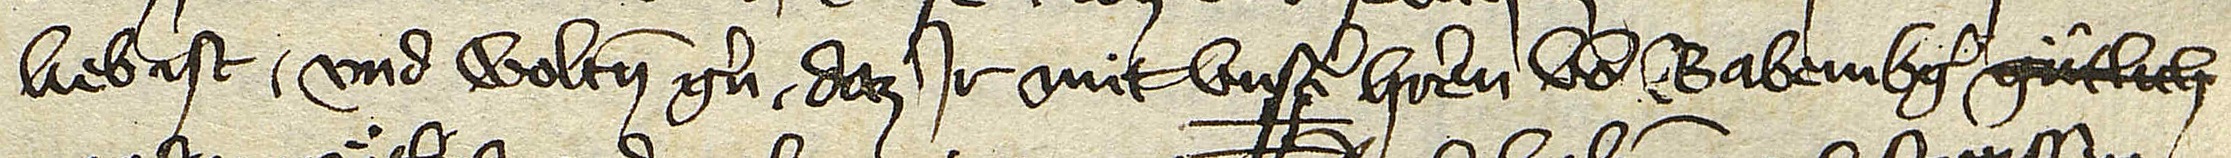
lieb iſt / vnd woltn* g*n / daʒ Ir mit vnſs* hr*en vo* Babembg* gütlich
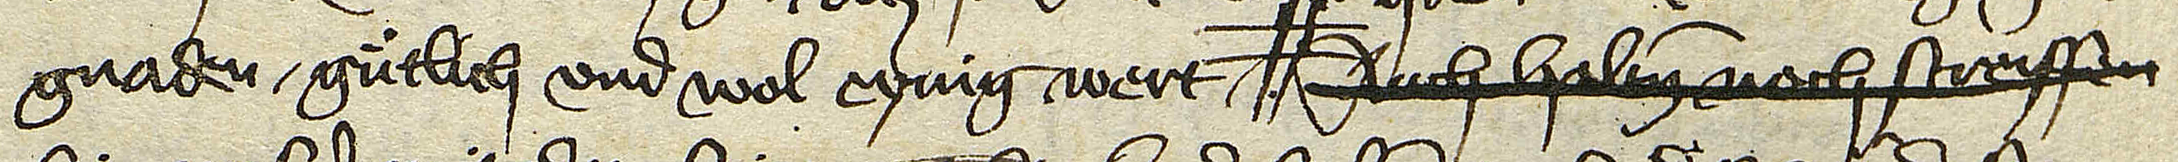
gnaden / gütlich vnd wol eynig wert / . Auch haltn* noch ſtreiffen
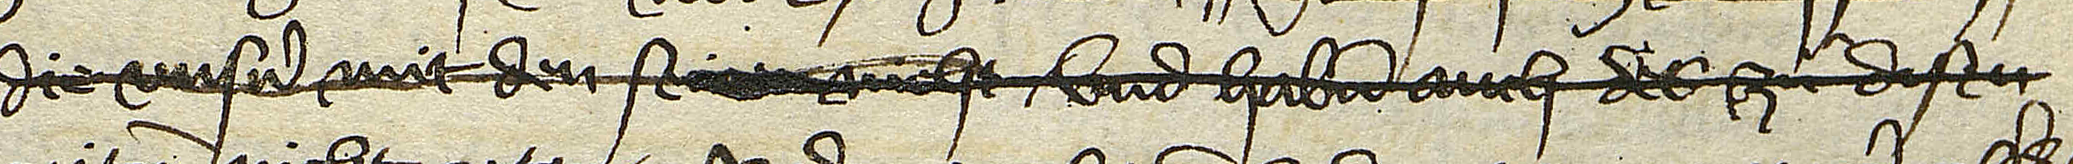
die vnſn* mit den ſeinen nicht / vnd habn* auch des cʒü diſen
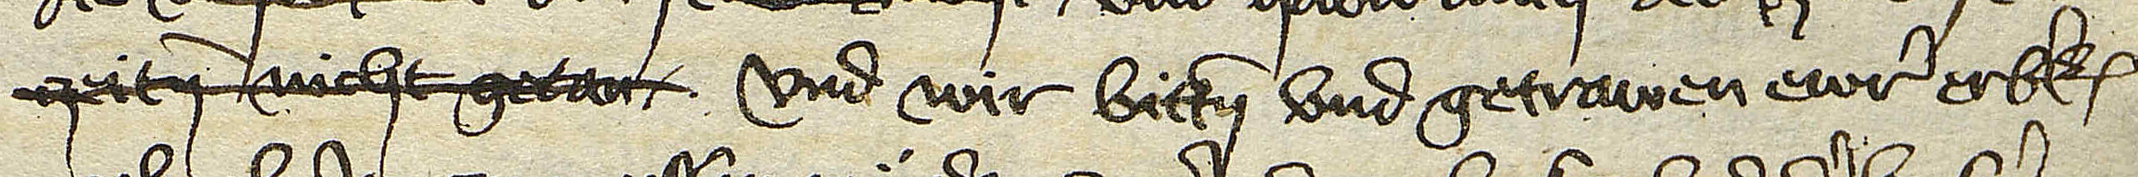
cʒeitn* nicht getan / . vnd wir bittn* vnd getrawen ewr* erberk*
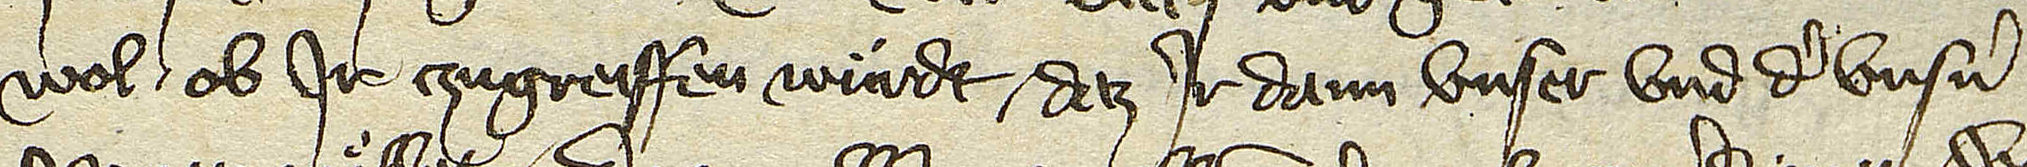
wol / ob Ir cʒugreiffen würdt / daʒ Ir dann vnſer vnd d* vnſn*
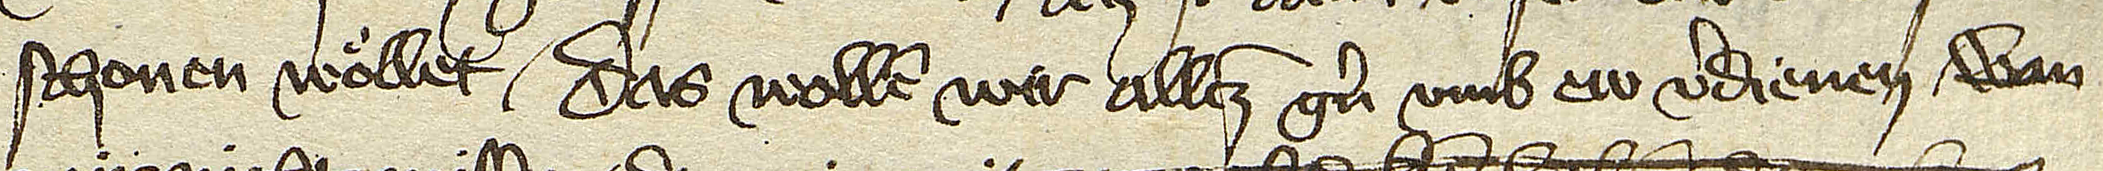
ſchonen wöllet / Das wolle* wir allcʒ* g*n vmb ew v* dienen / wan
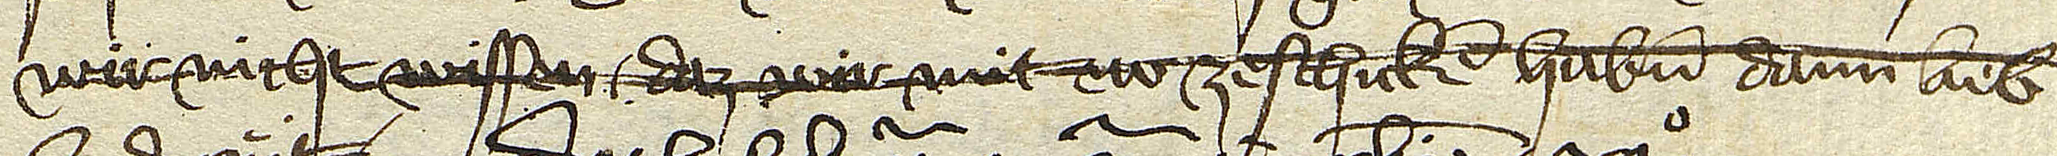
wir nicht wiſſen / daʒ wir mit ew cʒeſchicke* habn* dann lieb
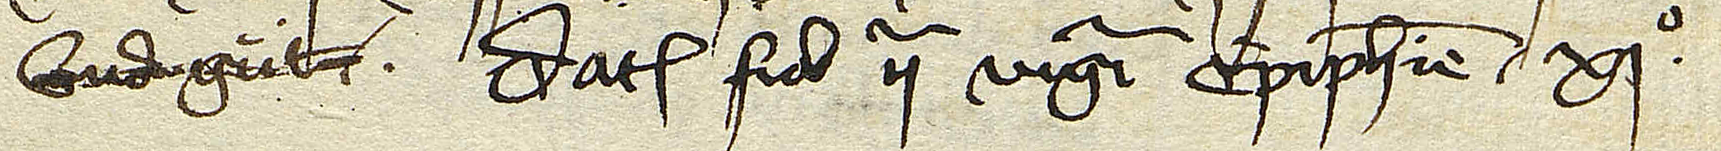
vnd güt* / . Dat* fia* ii* vigi* Epiphie* / xi* .
